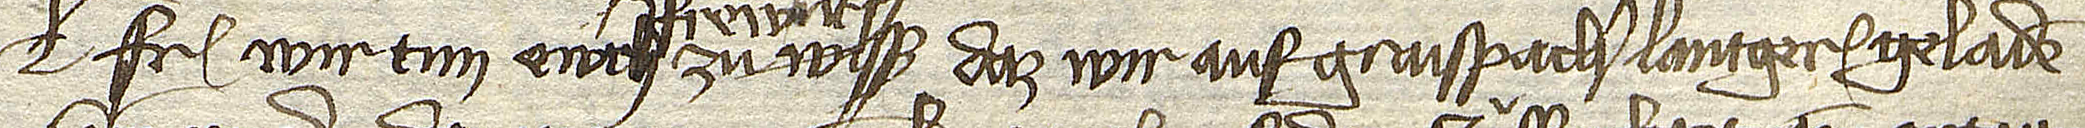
L* fr* wir tun eẅr* ʒu wiſſ* daʒ wir auf graiſpach* lantger* gelade*
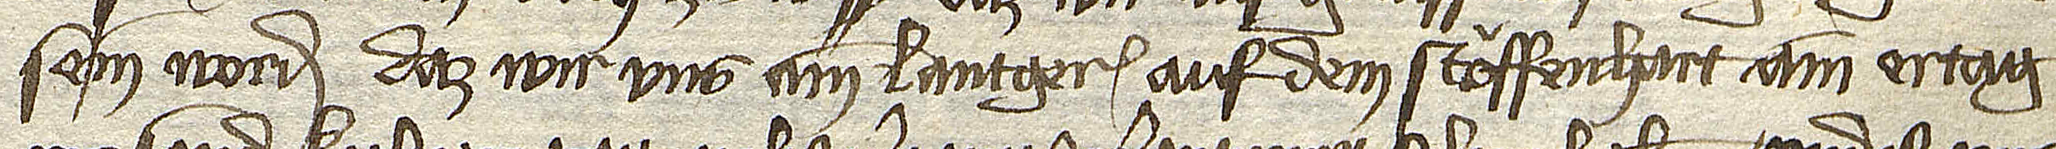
ſein word* daʒ wir vns am* lantger* auf dem ſtöffenhart am* ertag
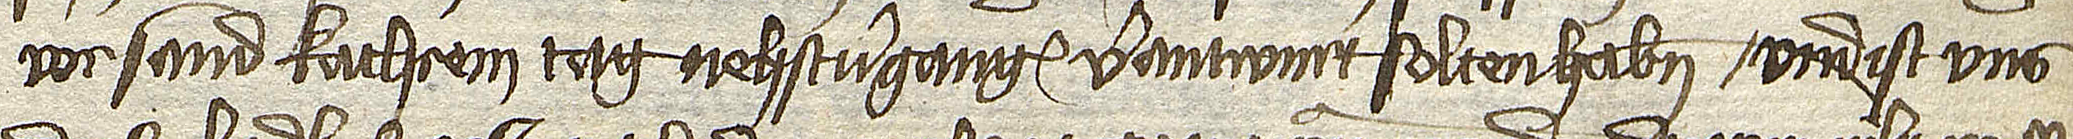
vor ſand kathrein tag nehſtu*gang* v*antwurt ſolten habn* / vnd iſt vns
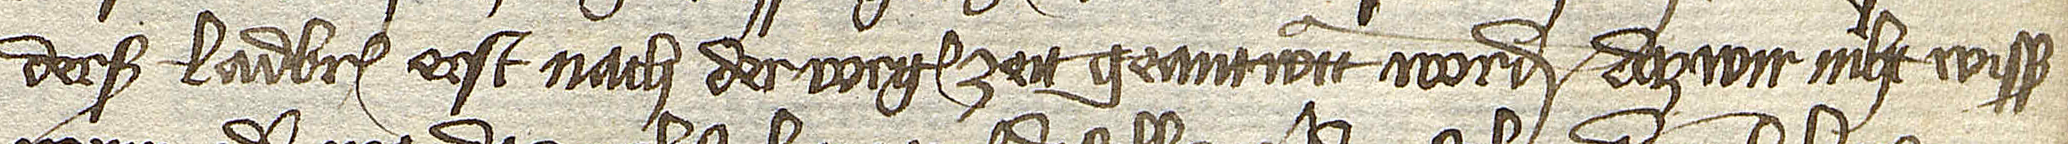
derſ* ladbr* erſt nach der vorg* ʒeit geantw*tt word* / daʒ wir niht wiſſ*
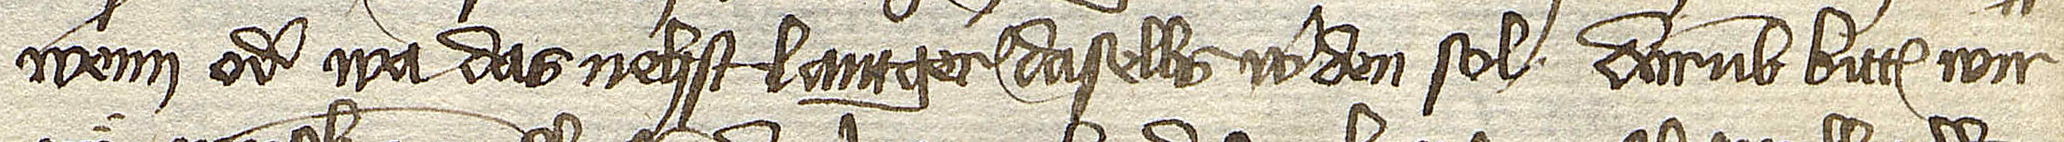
wenn od* wa das nehſt lantger* daſelbs w*den ſol . Darub* bitt* wir
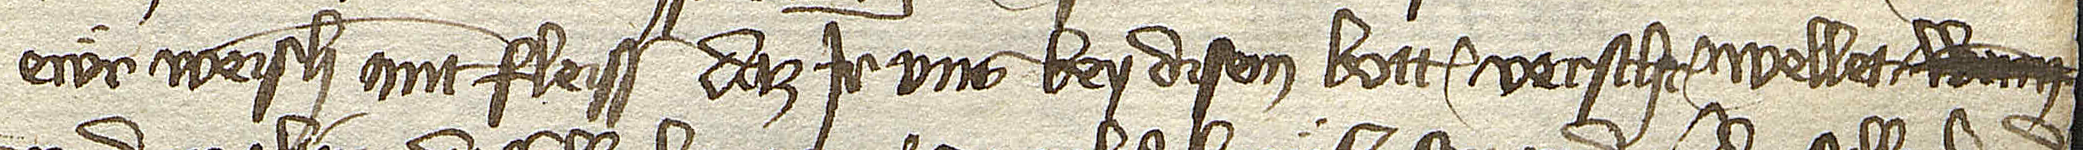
eẅr weiſh* mit fleiſſ Daʒ Ir vns bey diſem bott* verſchr* wellet / Wann*
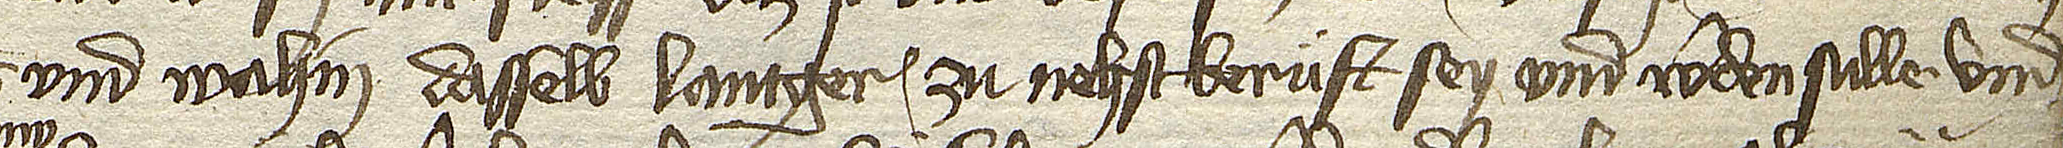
vnd wahin Daſſelb lantger* ʒu nehſt berüft ſey vnd w*den ſulle / vnd
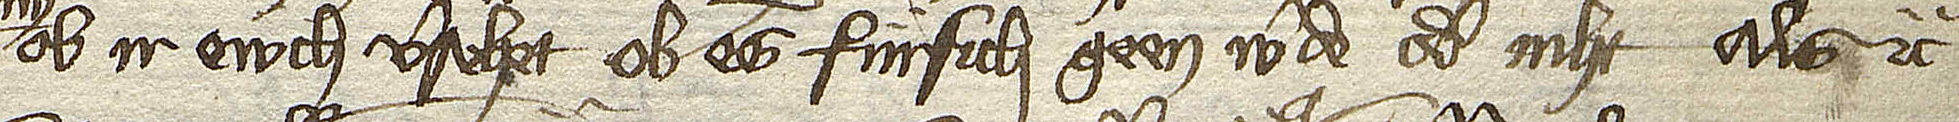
ob ir eẅch v*ſehet ob es für ſich geen w*de od* niht als ec*
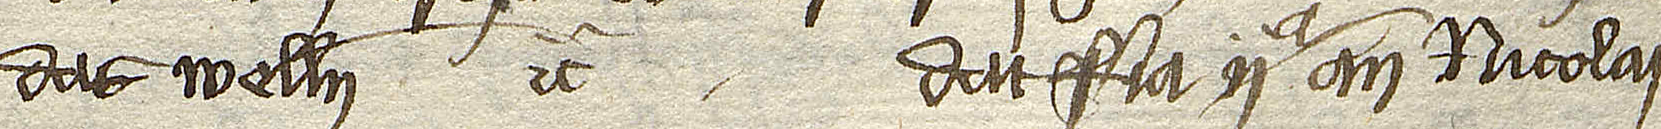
das welln* ec* / dat* fi*a ii* an* Nicolay
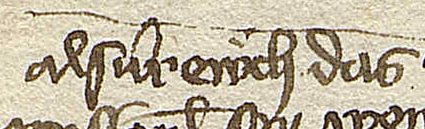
alſu*r eẅch das
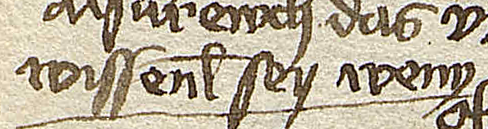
wiſſenl* ſey wenn
